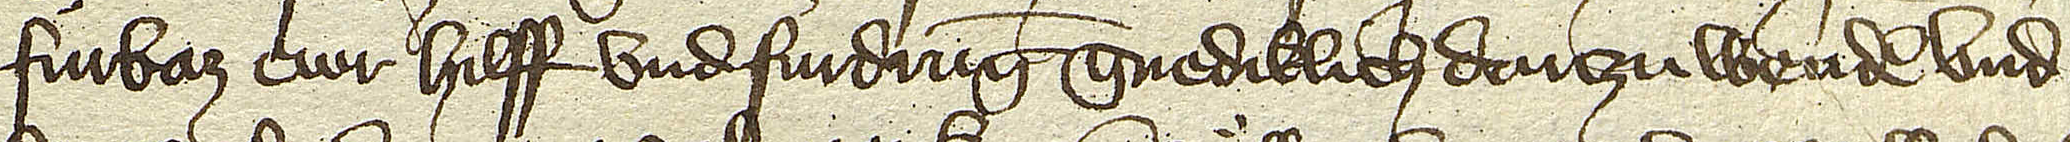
fürbaʒ ewr hilff vnd furdrug* gnediklich darcʒu wende* vnd
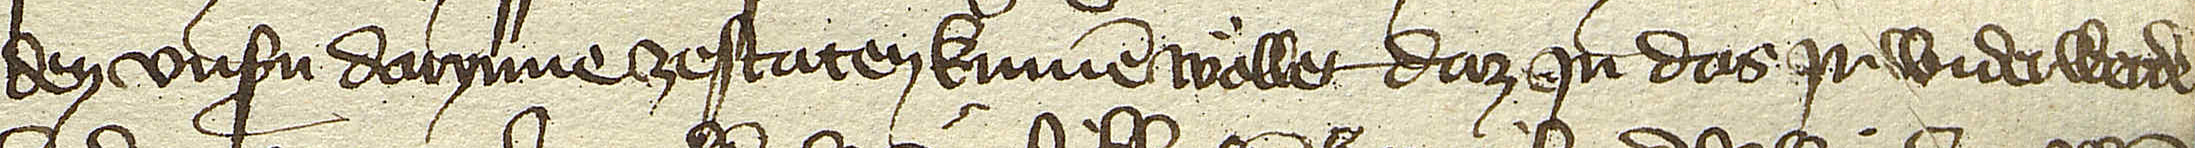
den vnſ*n darynne cʒetaten kume* wöllet daʒ In das Ir wider werde
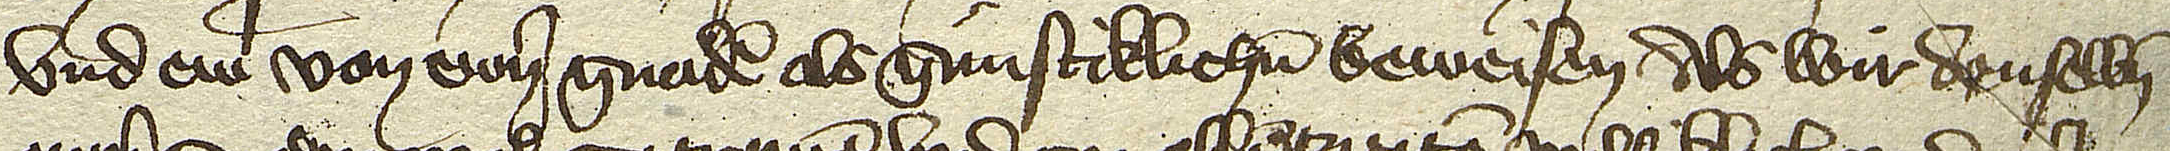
vnd ew von ewn* gnade* als günſtiklichn* beweiſen / Als wir denſelbn*
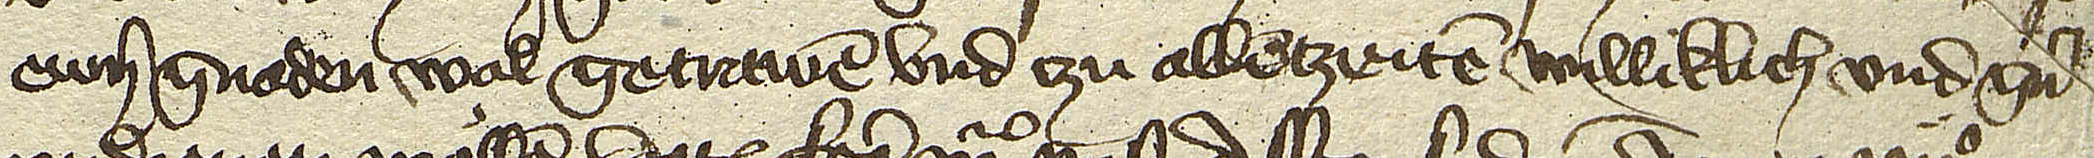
ewn* gnaden wol getrawe* vnd cʒu alle*cʒeite* williklich vnd gn*
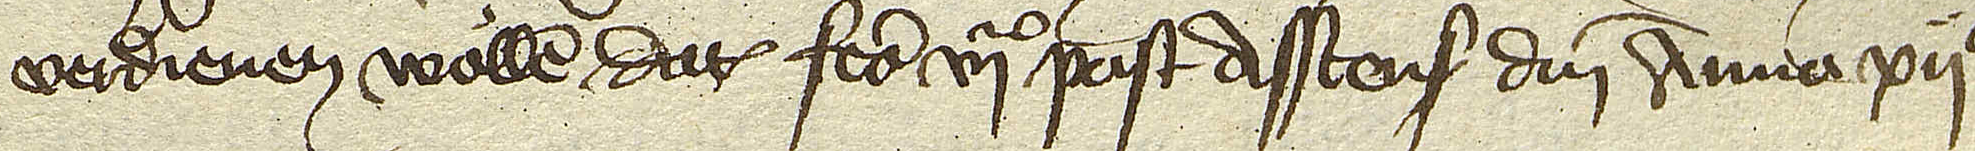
verdienen wölle* / dat* fea* vi* poſt Aſſcenſ* dni* Anno xii*
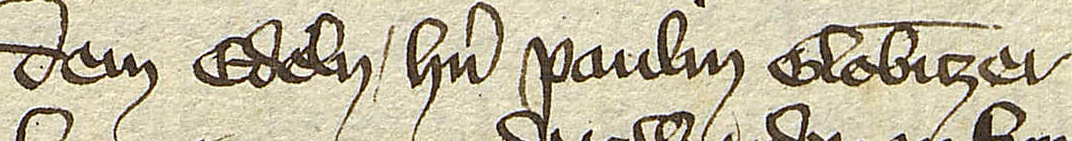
Dem Edeln / hn* paulin Globicʒer
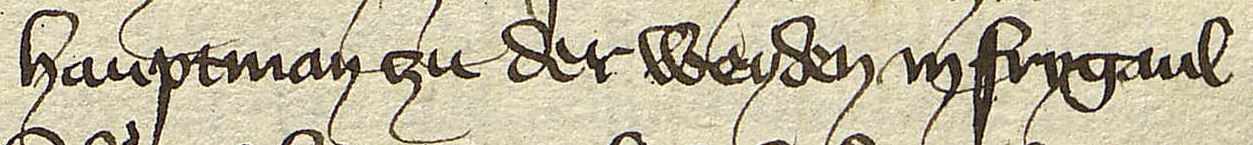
hauptman cʒu der Weyden in frygaul
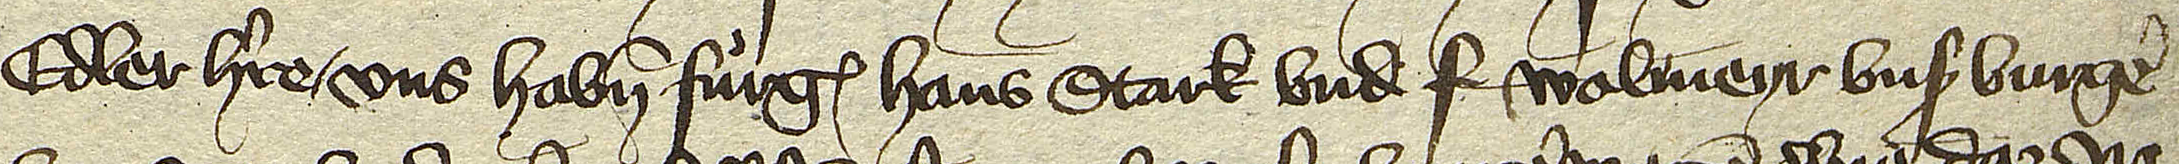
Edler h*re / vns habn* fürg* hans Stark vnd f wolmeyr vnſ* burge*
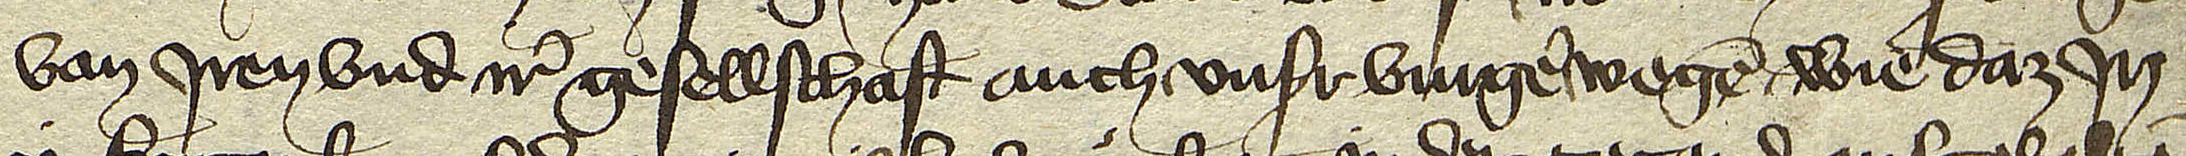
von Iren vnd ir* geſellſchaft auch vnſ*r burge* wege* / wie daʒ In
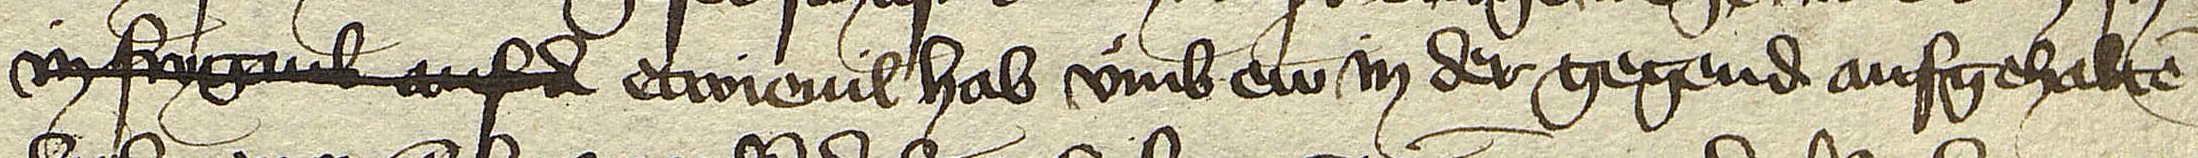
in frygaul auf d etwieuil hab v̈mb ew in der gegend aufgehalte*
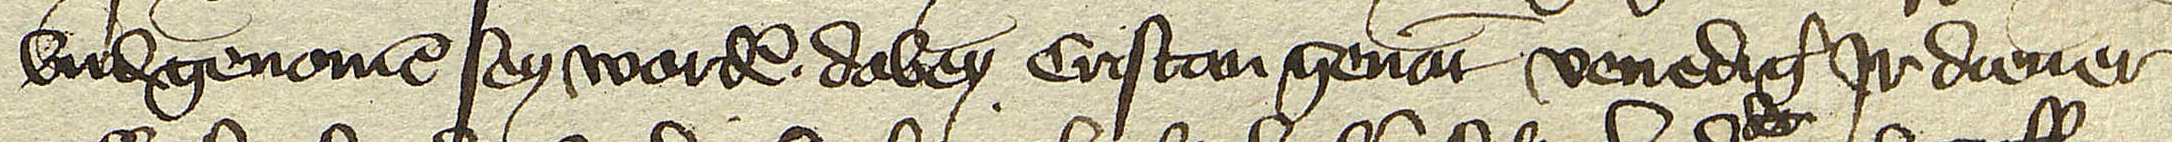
vnd genome* ſey worde* . dabey Criſtan genat* venedig* Ir diener
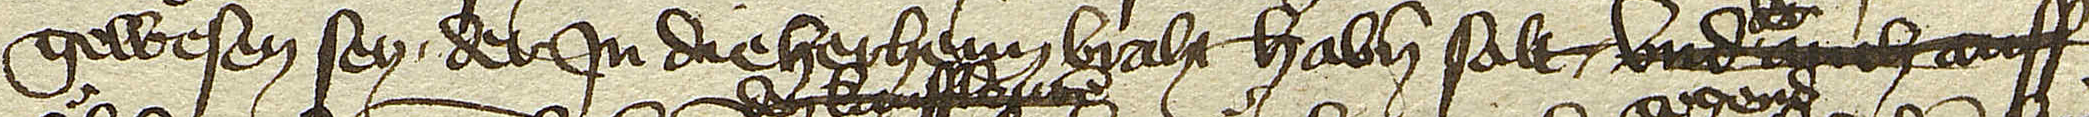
geweſen ſey / der In die herheim braht habn* ſolt / vnd auch auff
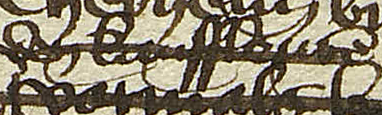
den kauffleute*
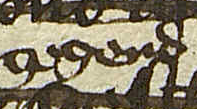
gegend
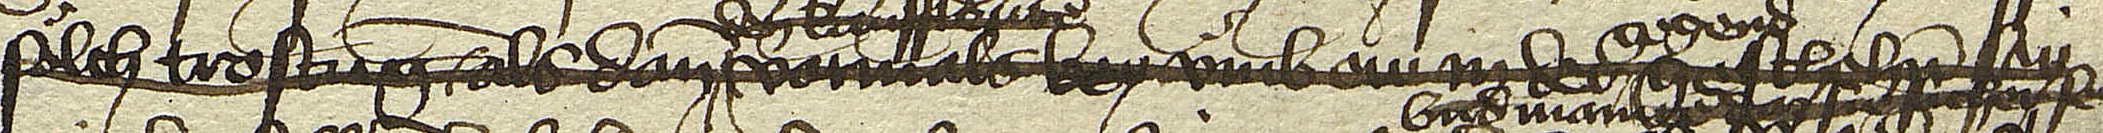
ſölich troſtug* / als dan* vormals bey v̈mb an in der geſchehn* ſey
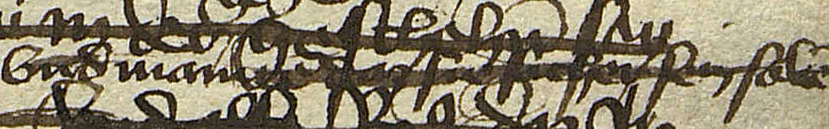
vnd mainte* daʒ ſie ſicher ſein ſolte*
